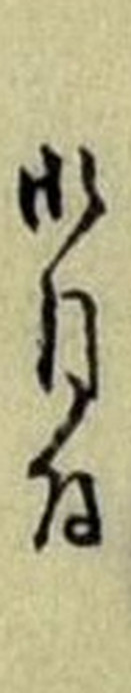御目付
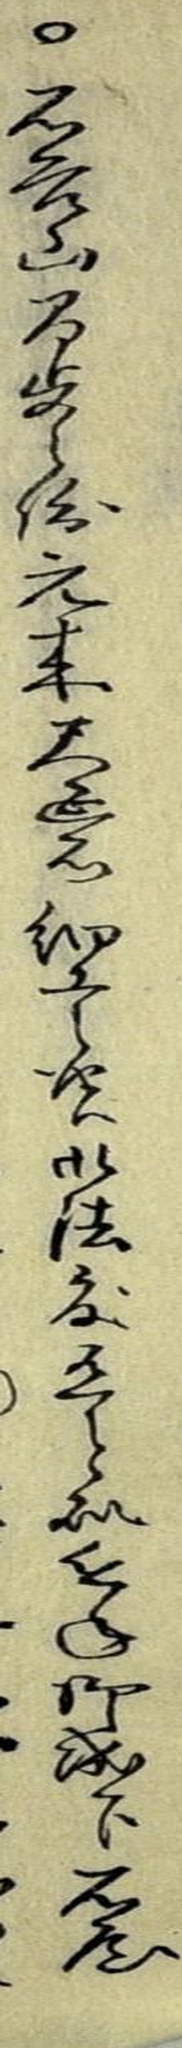○石谷山間歩之儀元来尺延石細工之儀ハ御法度有之候処近年御城下石屋
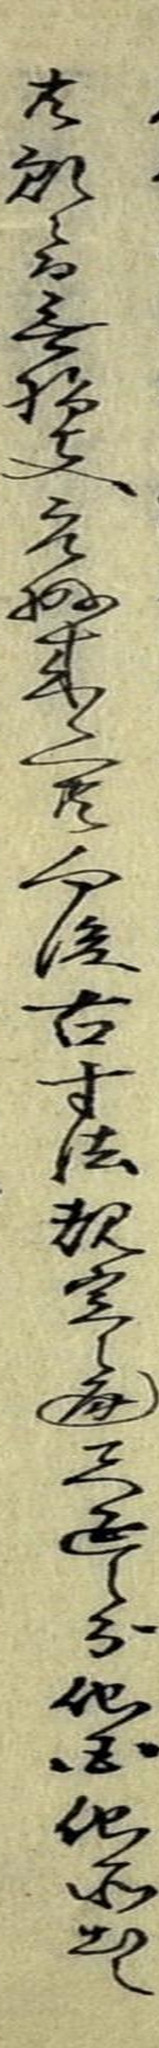共願ニ而無指支取扱来候へ共向後古寸法規定之通尺延之分他国他所出之
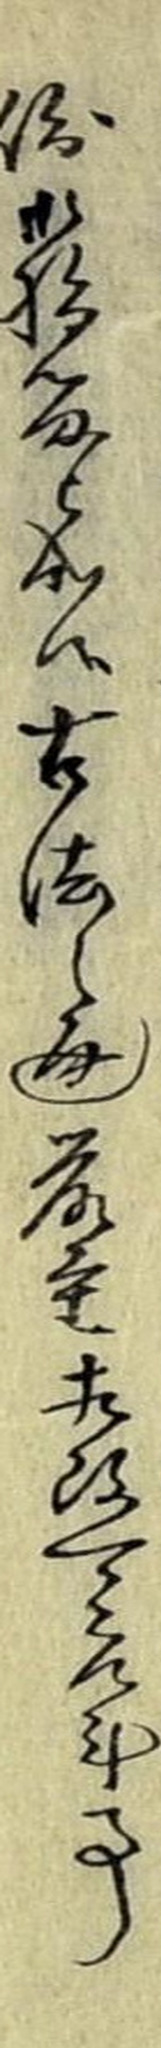儀御指留被成候古法之通厳重相改可取計事
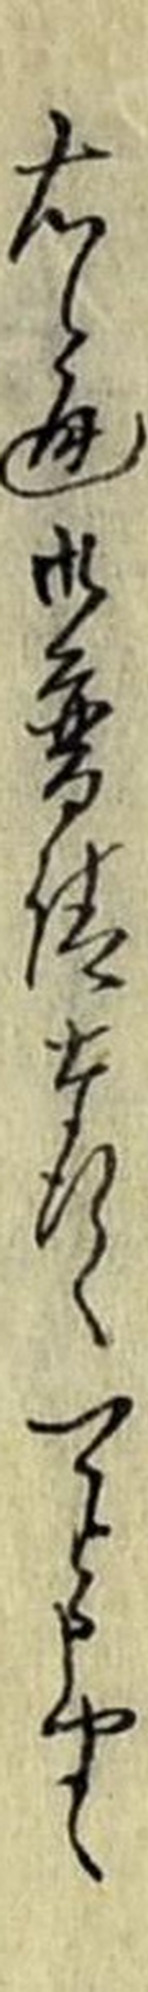右之通御普請奉行へ可被申聞候
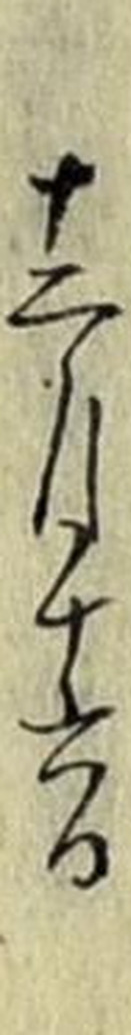十二月十六日
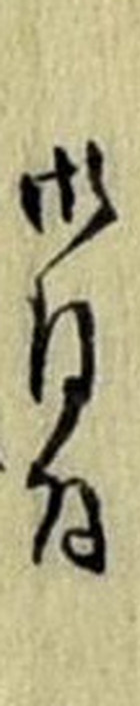御目付
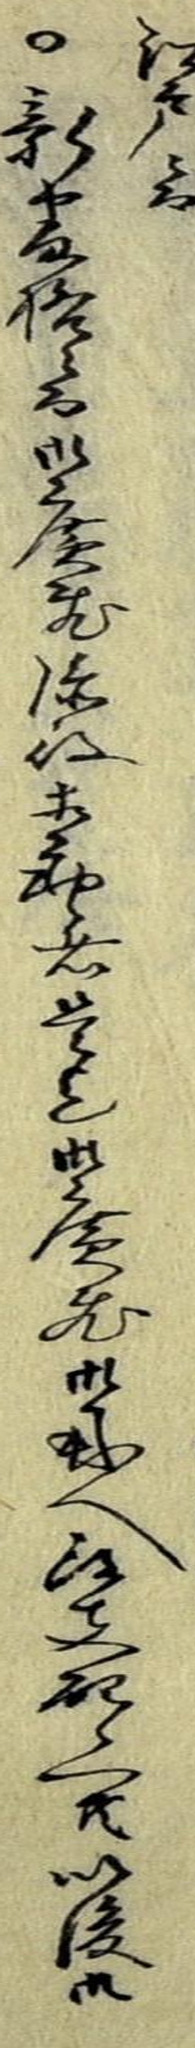○新番格ニ而御広敷添役相勤候者是迄御広敷御用人致支配候へ共以後御
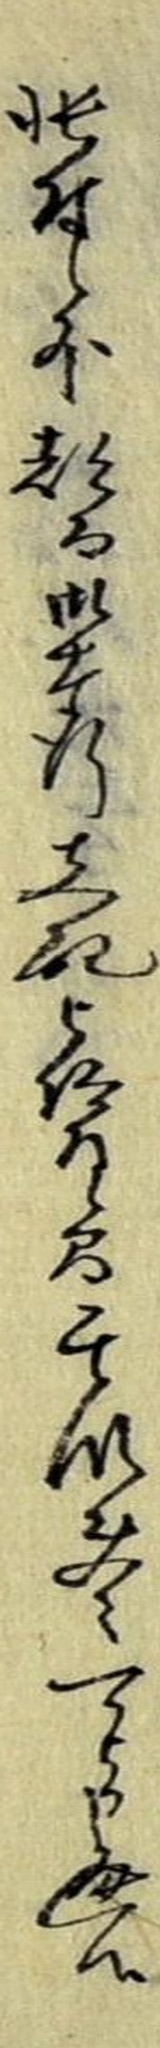帳付之外都而御奉行支配被仰付候間其段夫々可被申通候

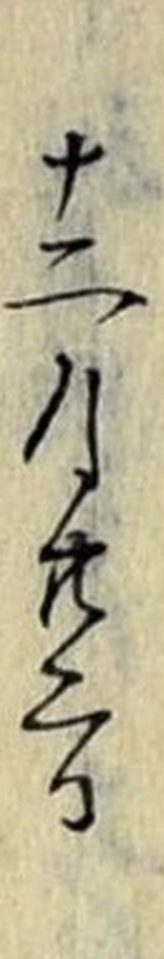十二月廿二日
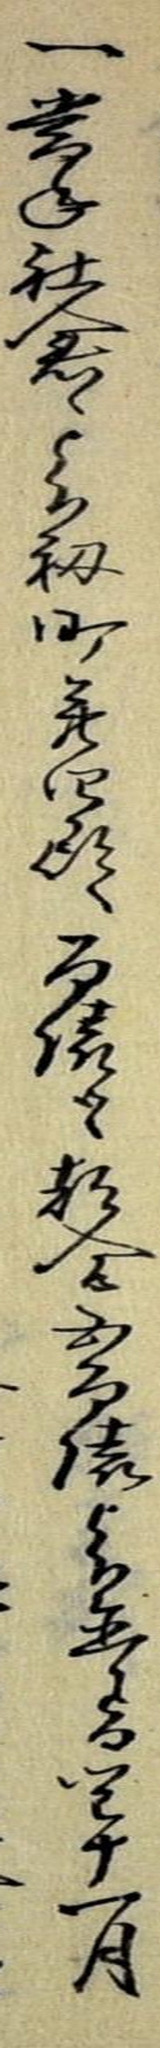一当年社倉へ被下籾町并四郡へ百俵ツヽ都合五百俵被下置候旨閏十一月
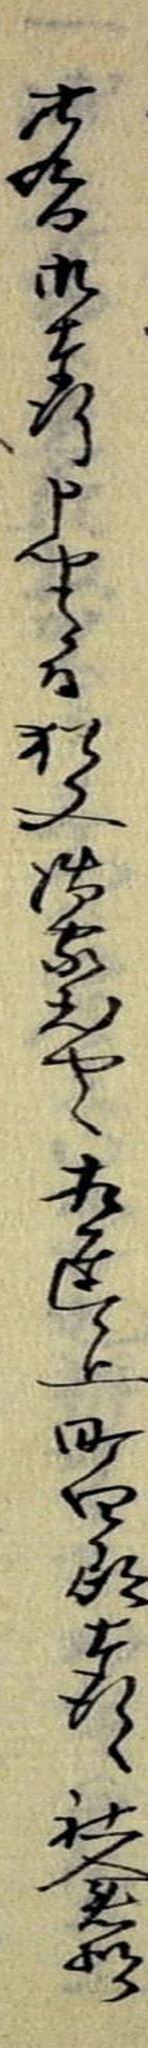廿九日御奉行申聞候ニ付猶又御家老中へ相達候上町四郡奉行へ社倉掛り
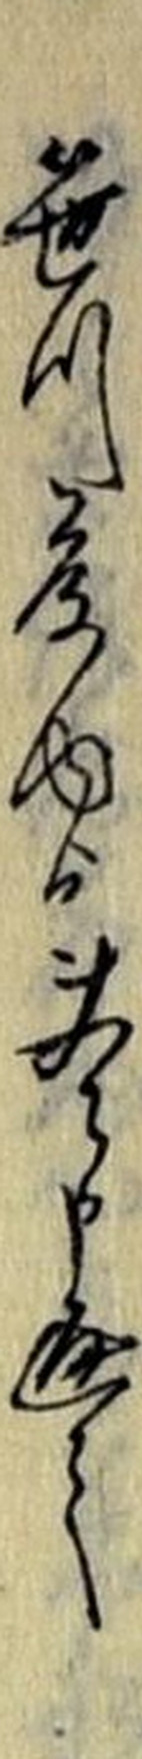笹川藤内ゟ夫々申通之
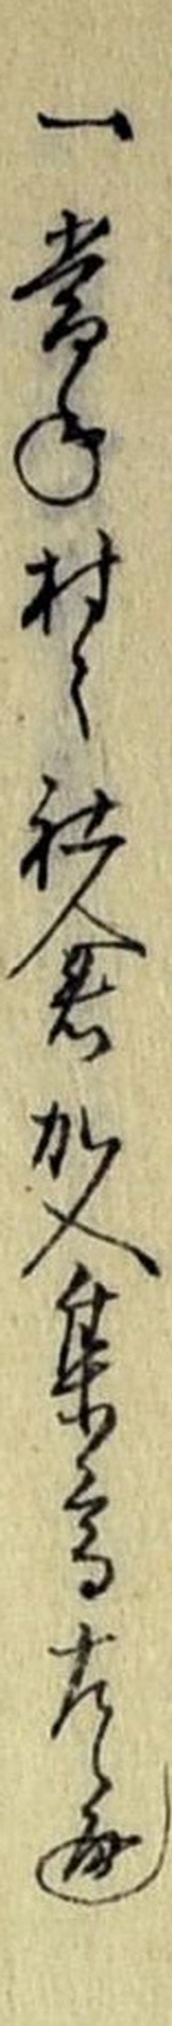一当年村々社倉加入集高左之通
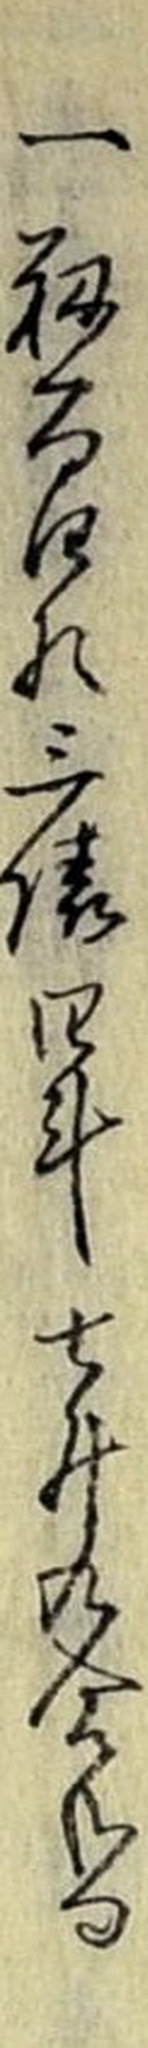一籾百四拾三俵四斗七升九合弐勺
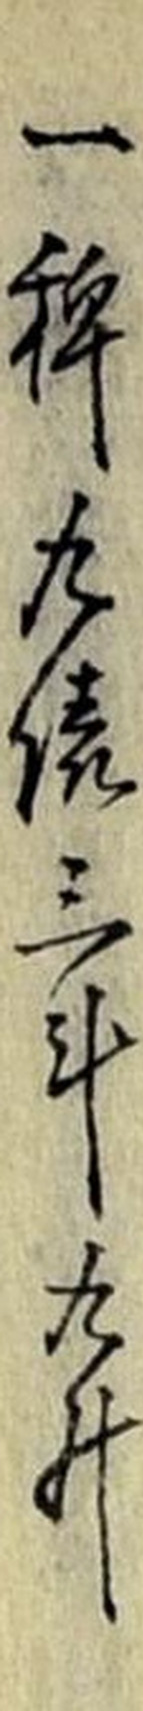一稗九俵三斗九升
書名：命令之部 五
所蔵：福井県文書館 Fukui Prefectural Archives
